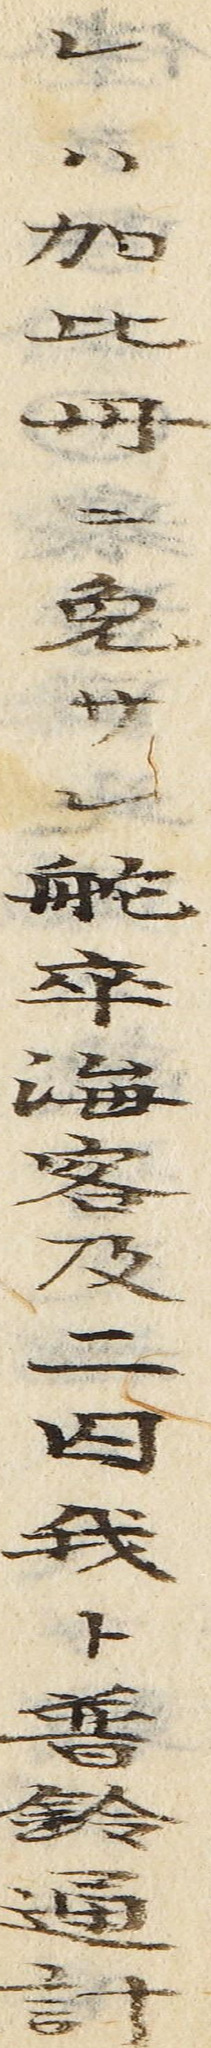レハ加比丹ニ免サレ舵卒海客及二囚我ト普鈴通計
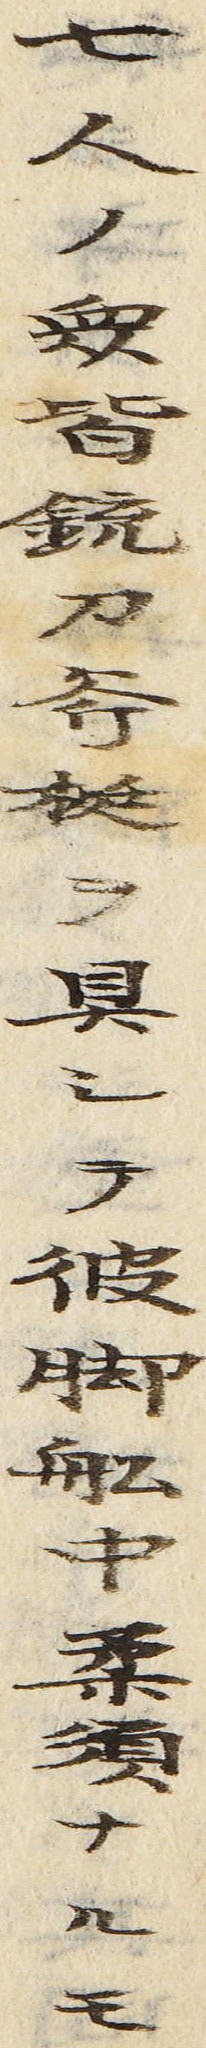七人ノ衆皆銃刀斧梃ヲ具シテ彼脚船中柔須ナルモ
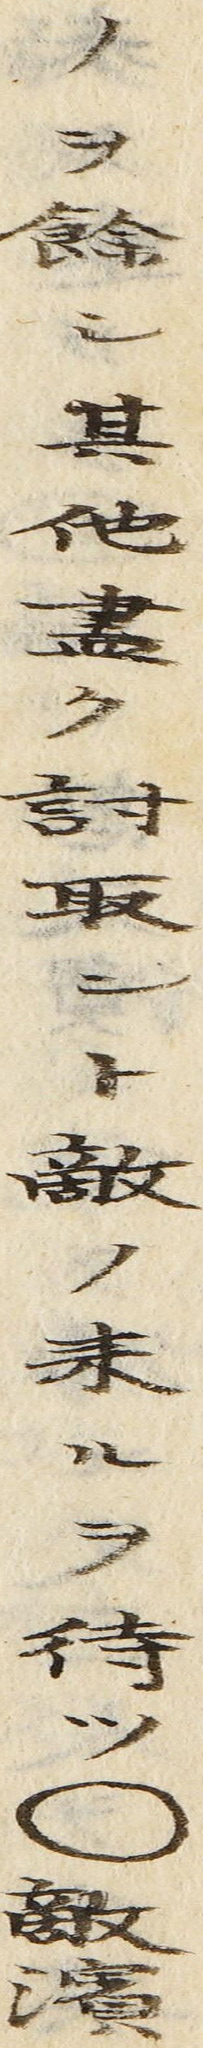ノヲ余シ其他尽ク討取ント敵ノ来ルヲ待ツ◯敵浜
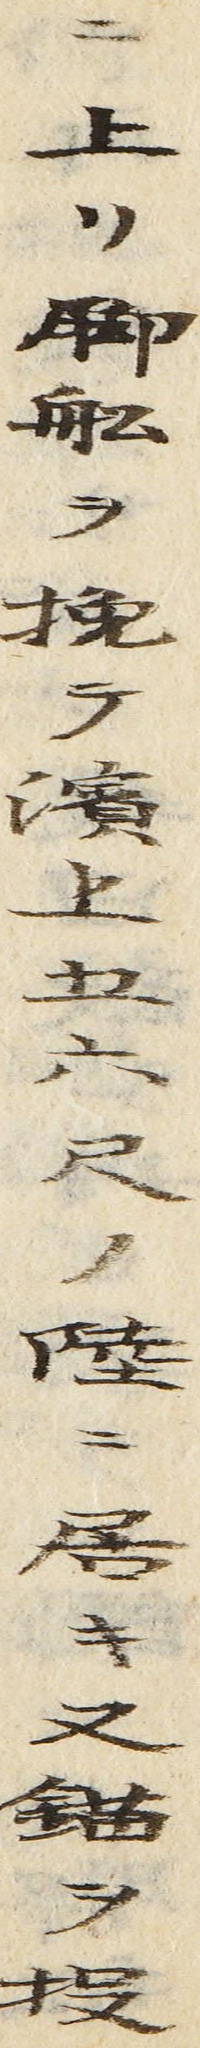ニ上リ脚船ヲ挽テ浜上五六尺ノ陸ニ居キ又錨ヲ投
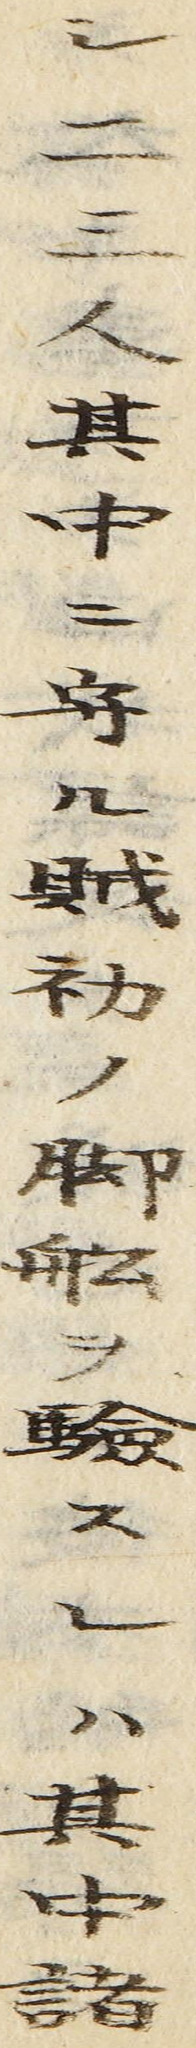シ二三人其中ニ守ル賊初ノ脚船ヲ験スレハ其中諸
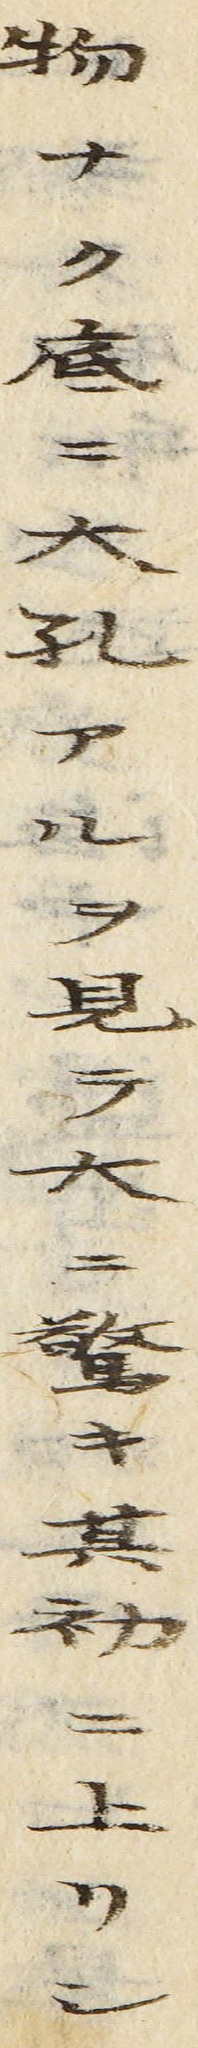物ナク底ニ大孔アルヲ見テ大ニ驚キ其初ニ上リシ
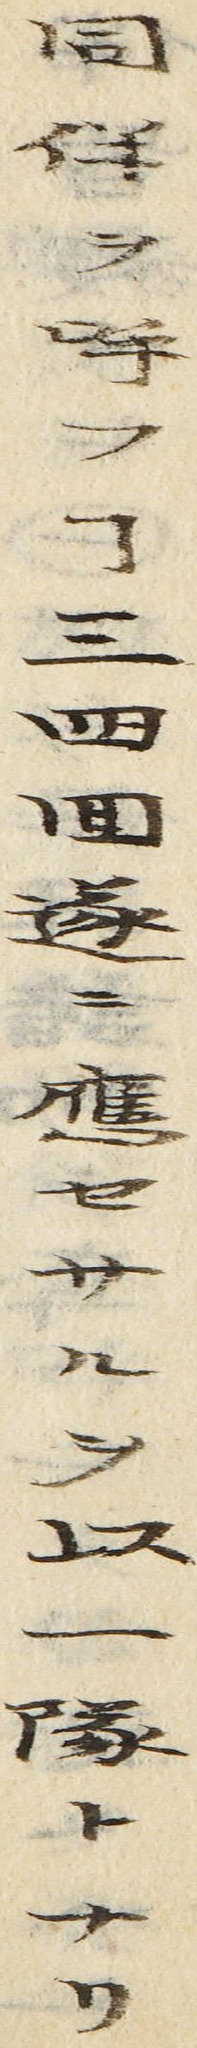同伴ヲ呼フコト三四回遂ニ応セサルヲ以一隊トナリ
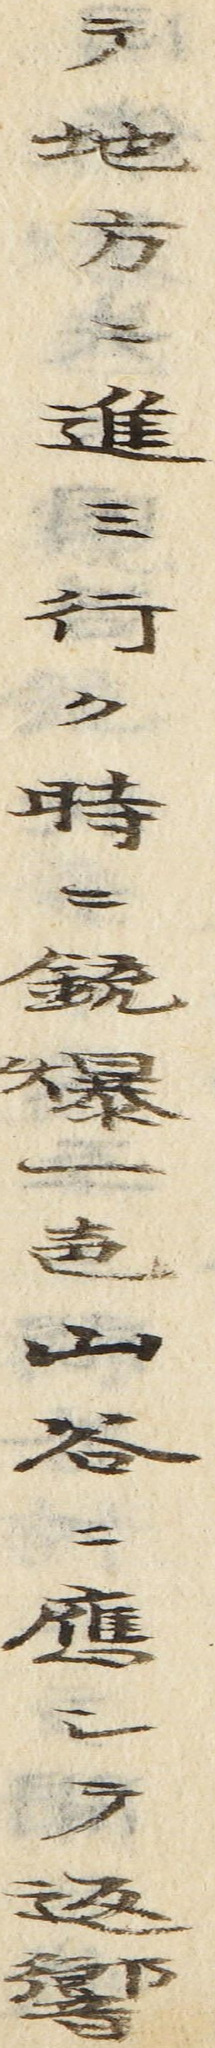テ地方ニ進ミ行ク時ニ銃爆一声山谷ニ応シテ返響
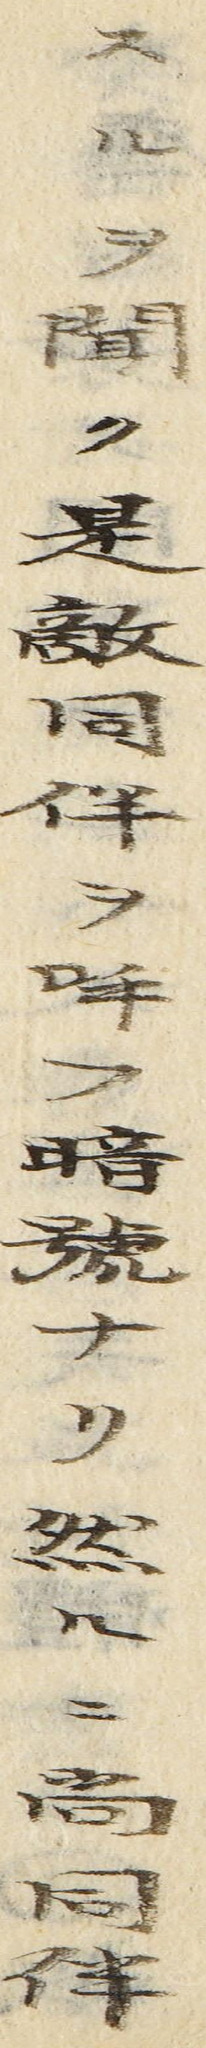スルヲ聞ク是敵同伴ヲ呼フ暗号ナリ然ルニ尚同伴

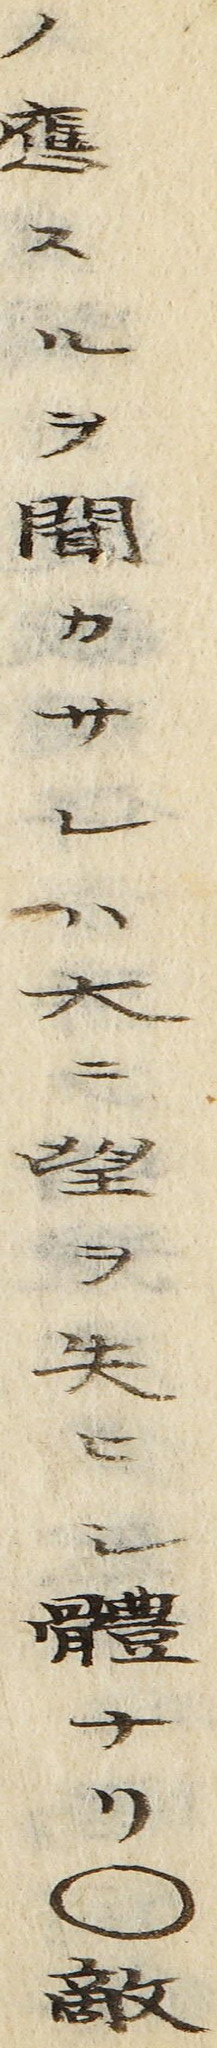ノ応スルヲ聞カサレハ大ニ望ヲ失ヒシ体ナリ◯敵
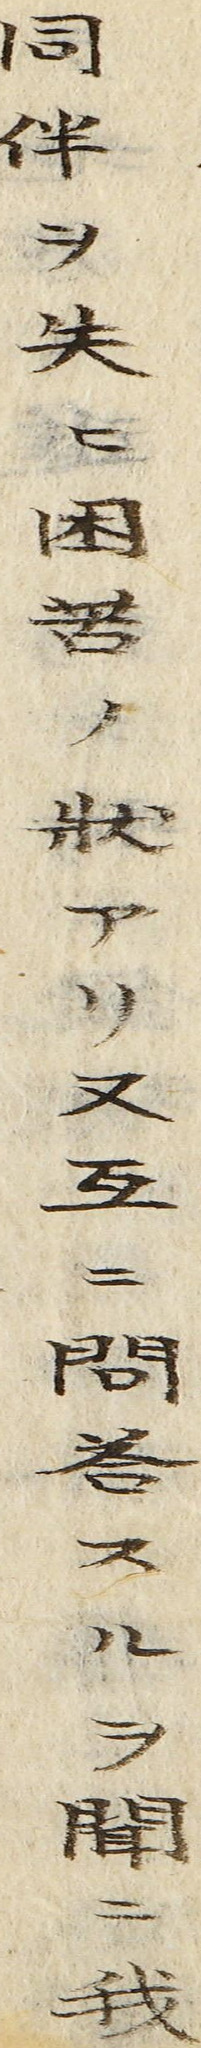同伴ヲ失ヒ困苦ノ状アリ又互ニ問答スルヲ聞ニ我
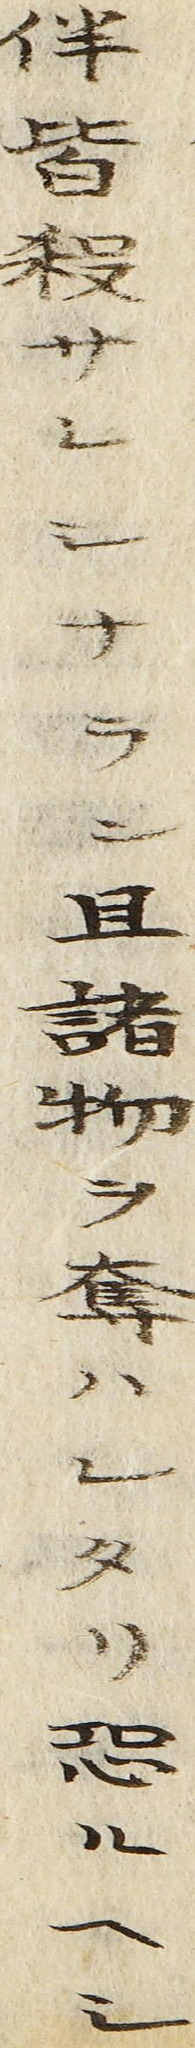伴皆殺サレシナラン且諸物ヲ奪ハレタリ恐ルヘシ
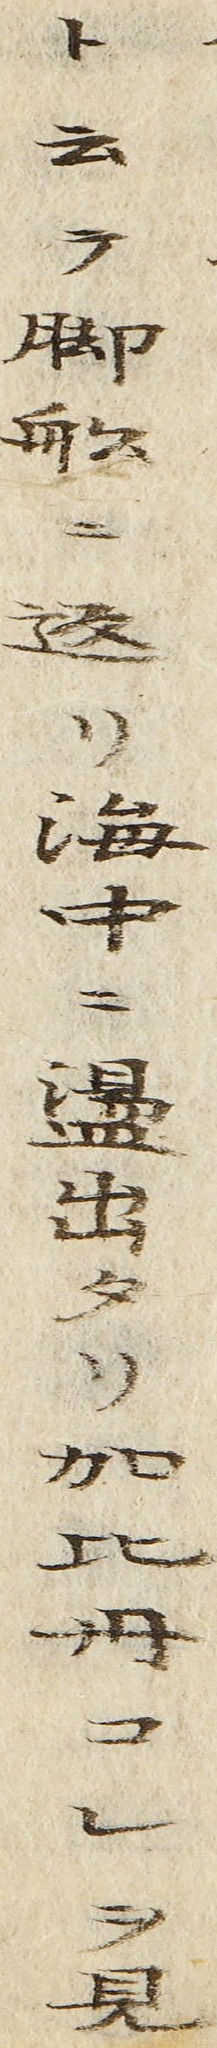ト云テ脚船ニ返リ海中ニ盪出タリ加比丹コレヲ見
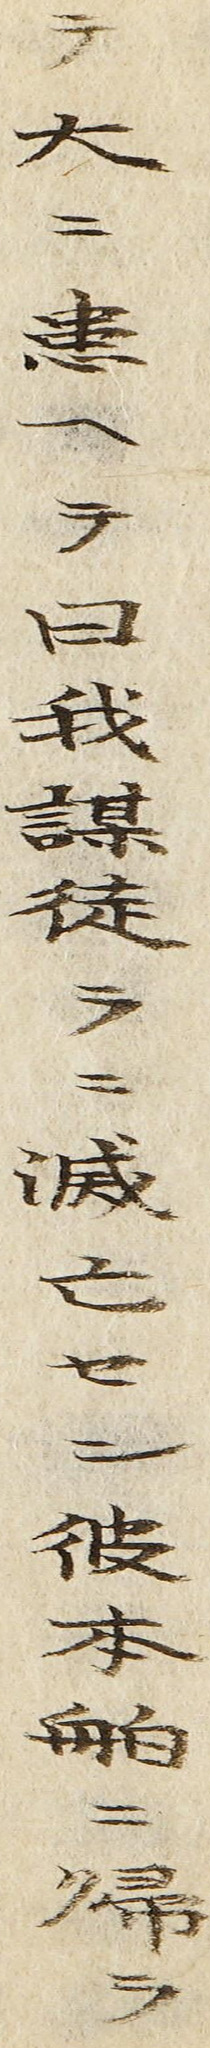テ大ニ患ヘテ曰我謀徒ラニ滅亡セン彼本舶ニ帰ラ
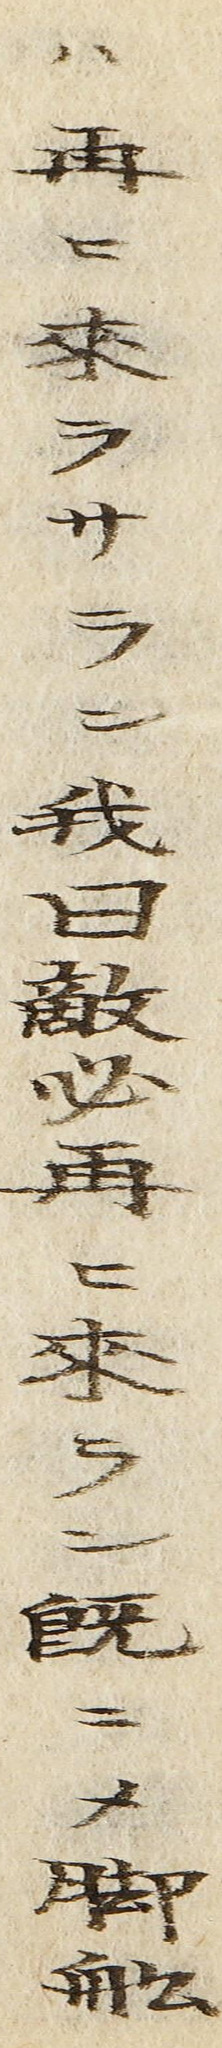ハ再ヒ来ラサラン我曰敵必再ヒ来ラン既ニシテ脚船
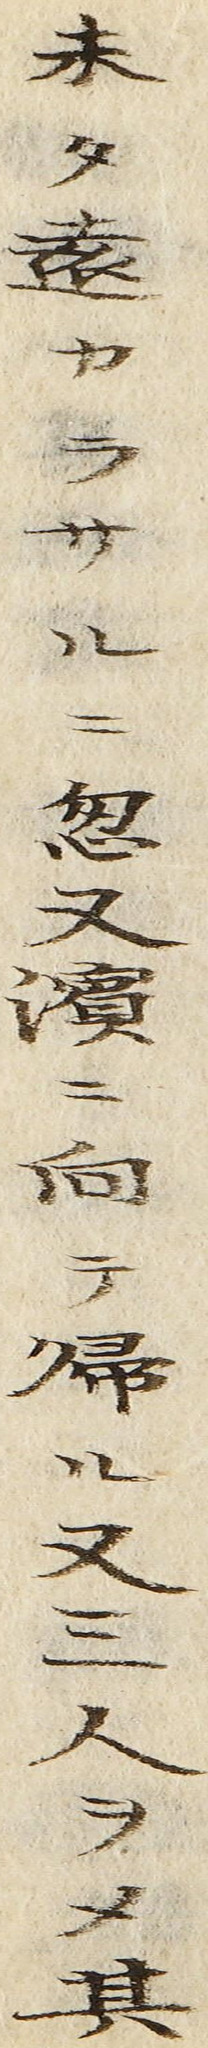未タ遠カラサルニ忽又浜ニ向テ帰ル又三人ヲシテ其
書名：漂流紀事
